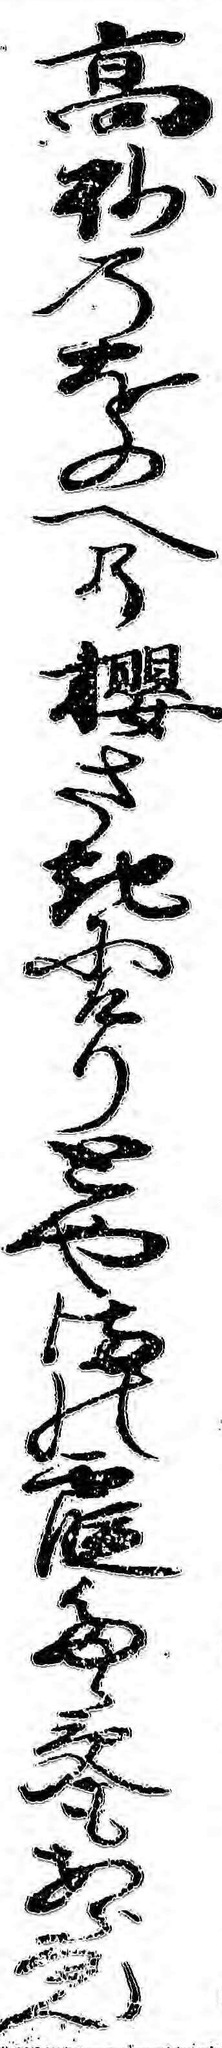高砂のをのへの桜さきにけりとやまの霞たゝずもあらなむ
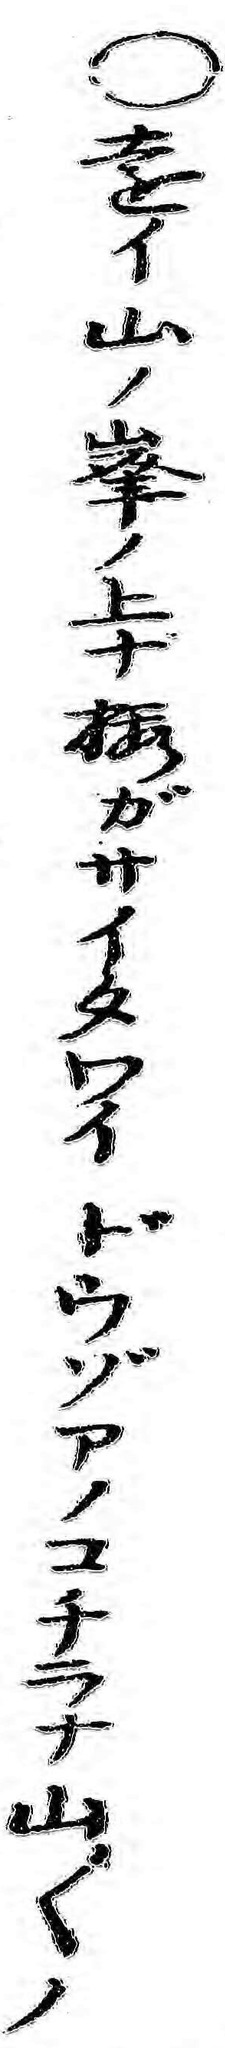○遠イ山ノ峯ノ上ナ桜ガサイタワイドウゾアノコチラナ山〳〵ノ
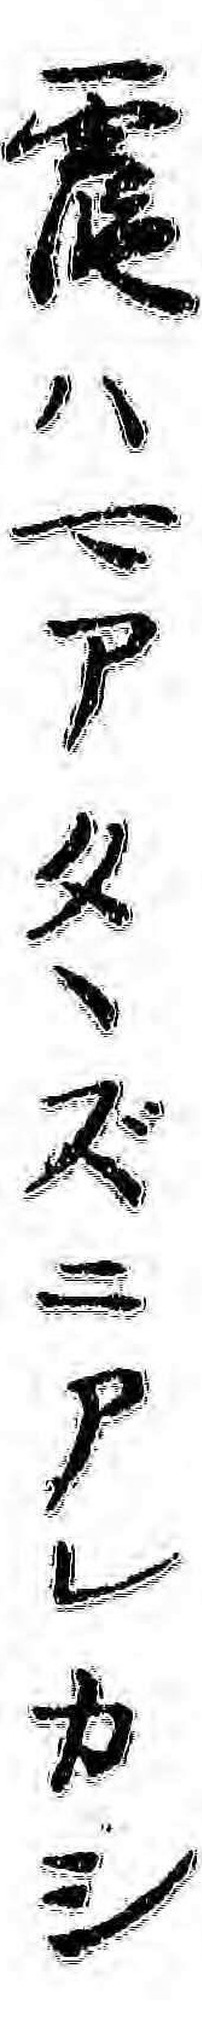霞ハマアタヽズニアレカシ
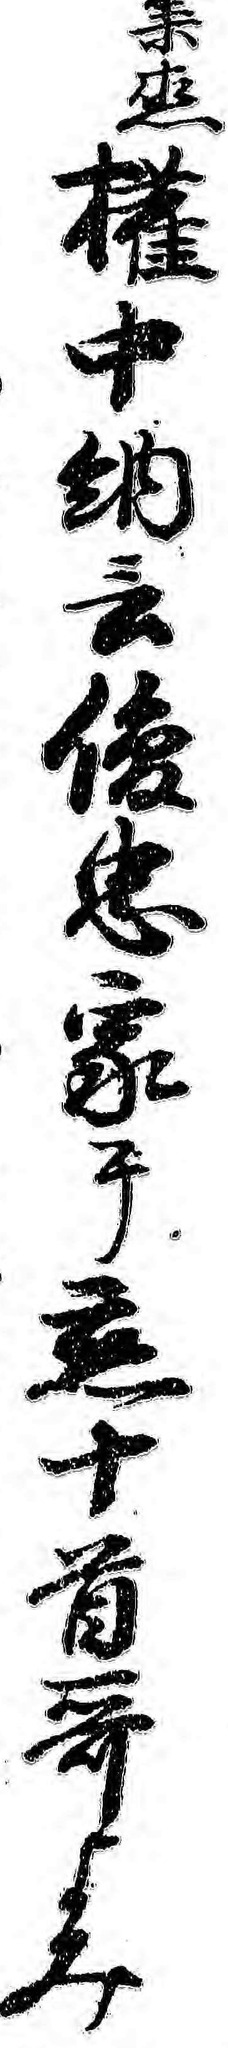千載集恋権中納言俊忠家に恋十首哥よみ
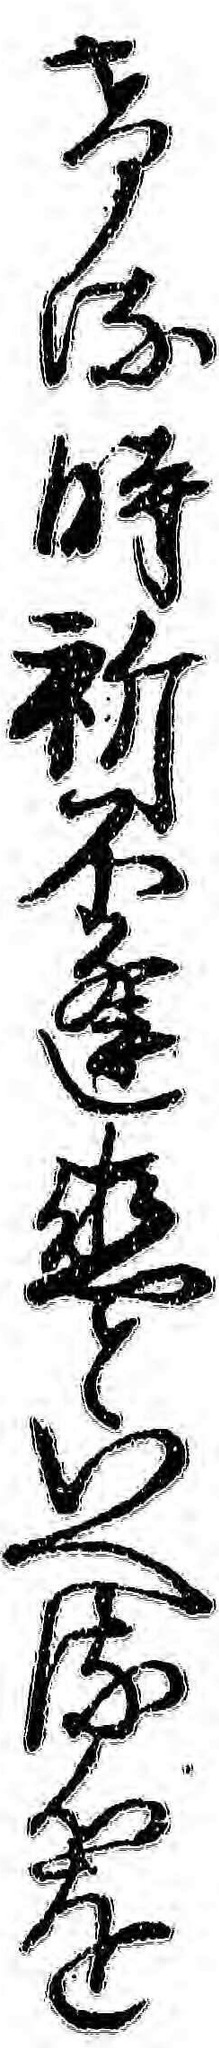ける時祈不逢恋といへる心を
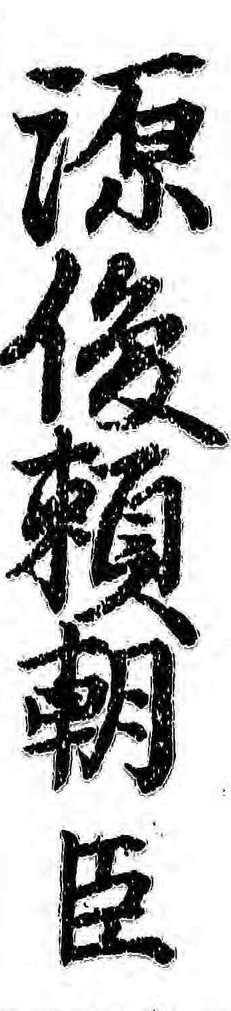源俊頼朝臣
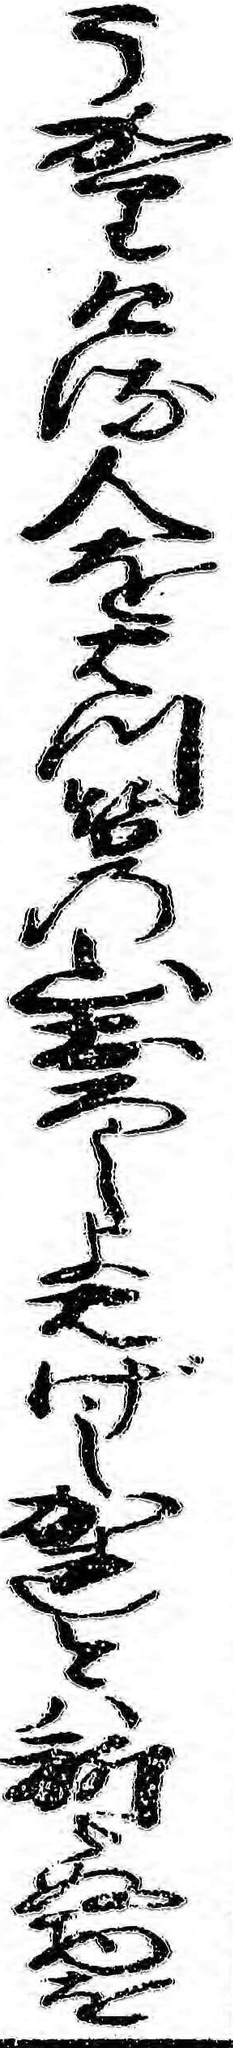うかりける人をはつせの山おろしよはげしかれとは祈らぬ物を
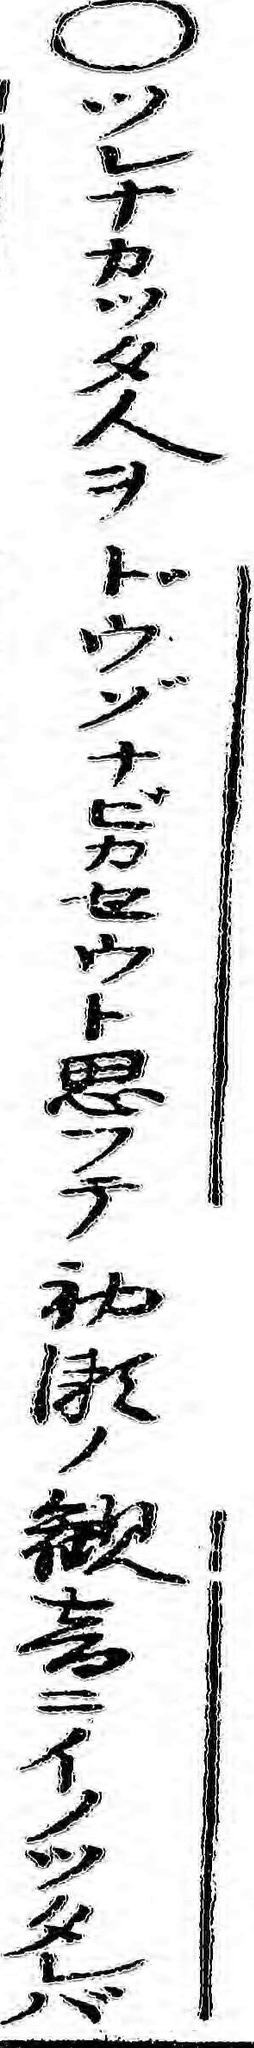○ツレナカツタ人ヲドウゾナビカセウト思フテ初瀬ノ観音ニイノツタレバ
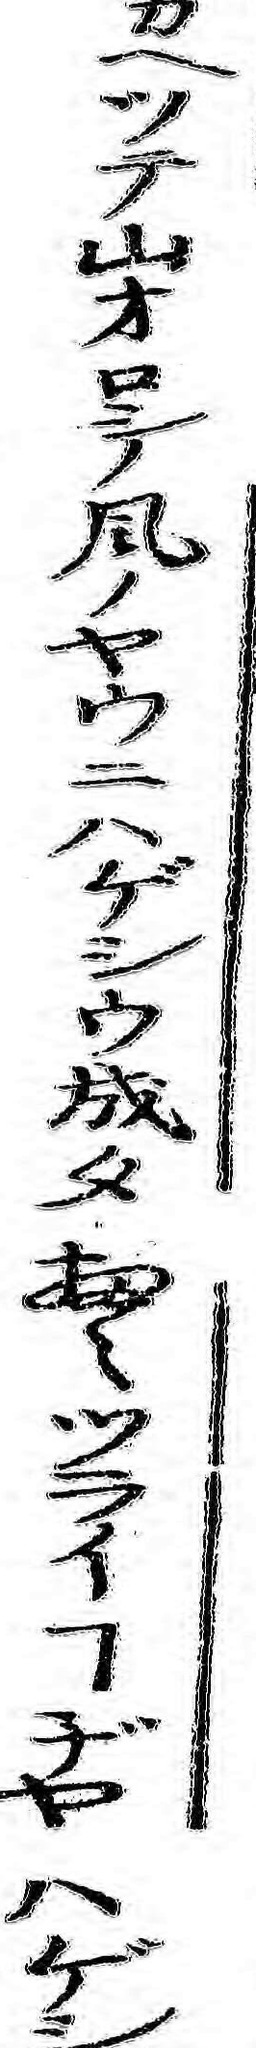カエツテ山オロシノ風ノヤウニハゲシウ成タ扨々ツライコトヂヤハゲシ
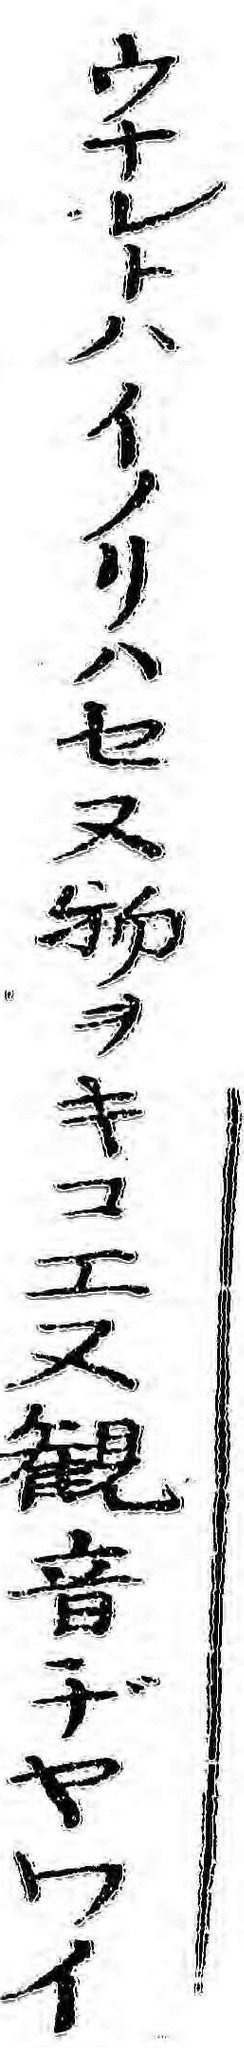ウナレトハイノリハセヌ物ヲキコエヌ観音ヂヤワイ
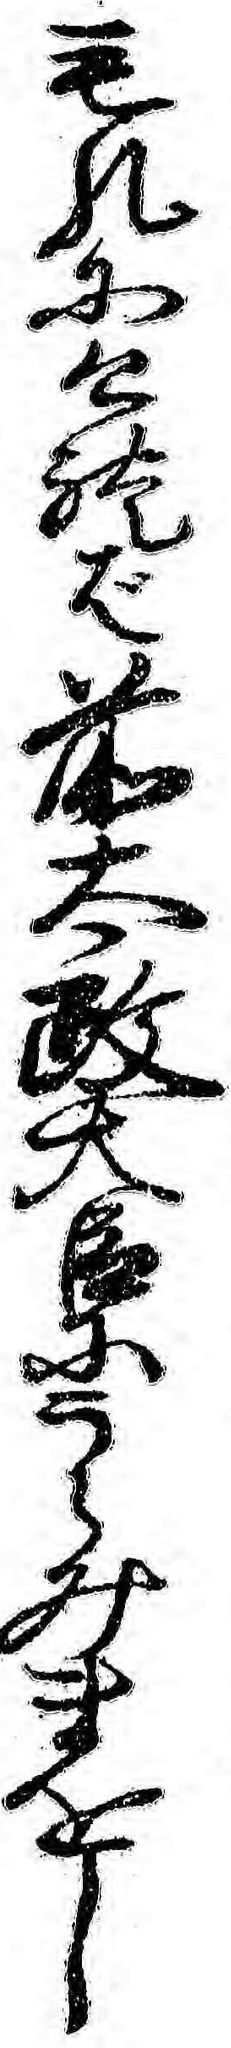もれにければ前太政大臣にうらみまをし
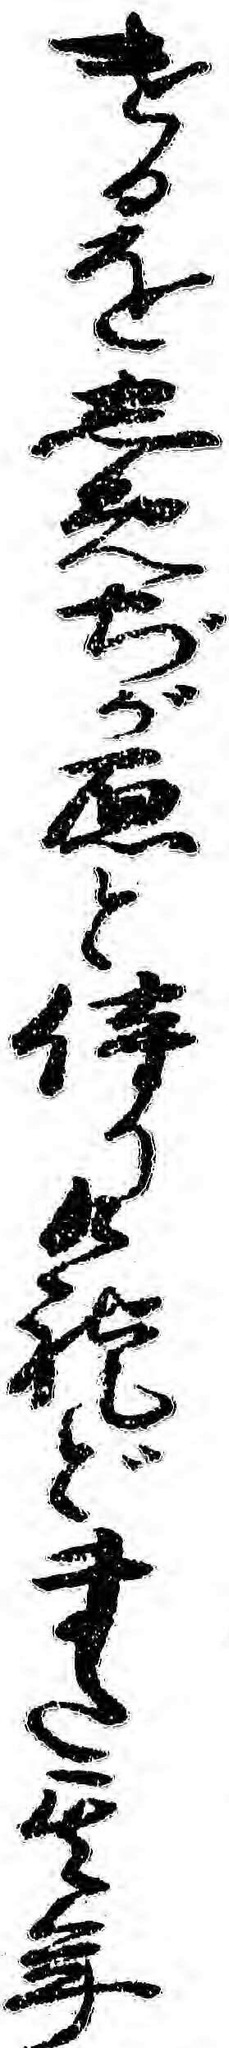けるをしめぢが原と侍りけれどまた其年
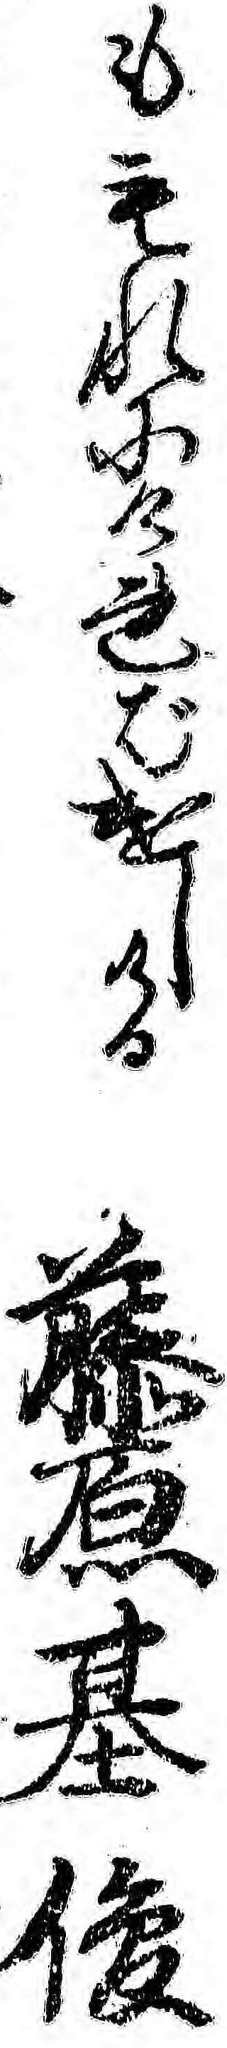ももれにければ遣しける藤原基俊
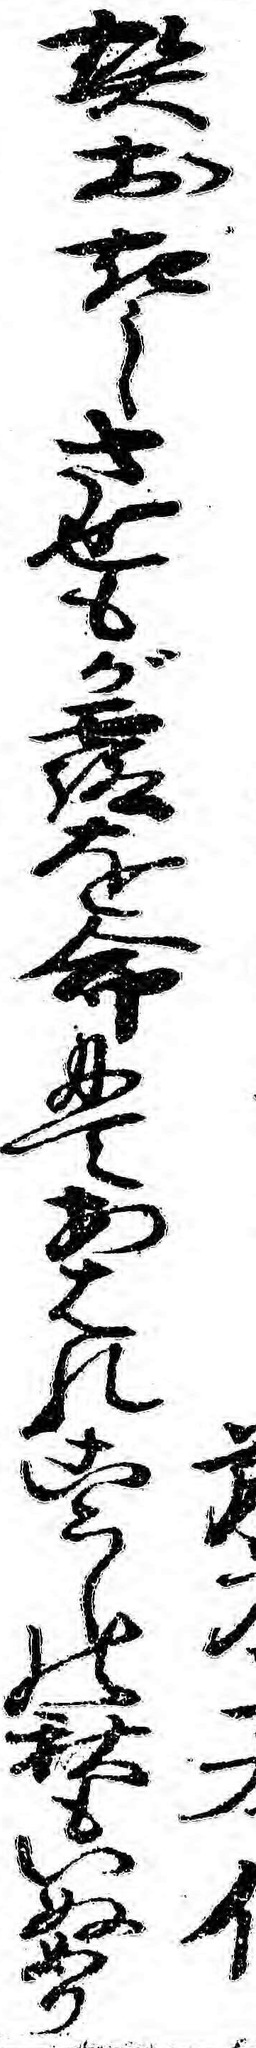契おきしさせもが露を命にてあはれことしの秋もいぬめり
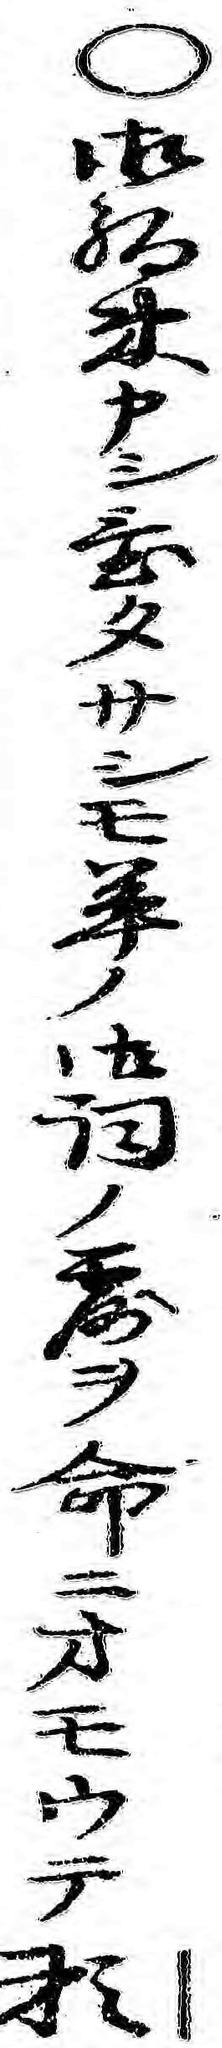○御約束申シ置タサシモ草ノ御詞ノ露ヲ命ニオモウテ頼

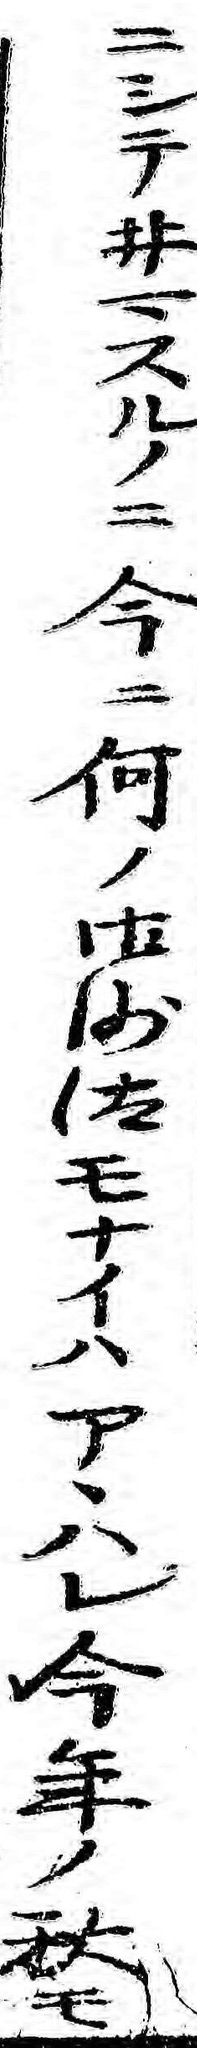ニシテヰマスルノニ今ニ何ノ御沙汰モナイハアヽハレ今年ノ秋モ
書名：百人一首／小倉の山ふみ
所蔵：国文学研究資料館
